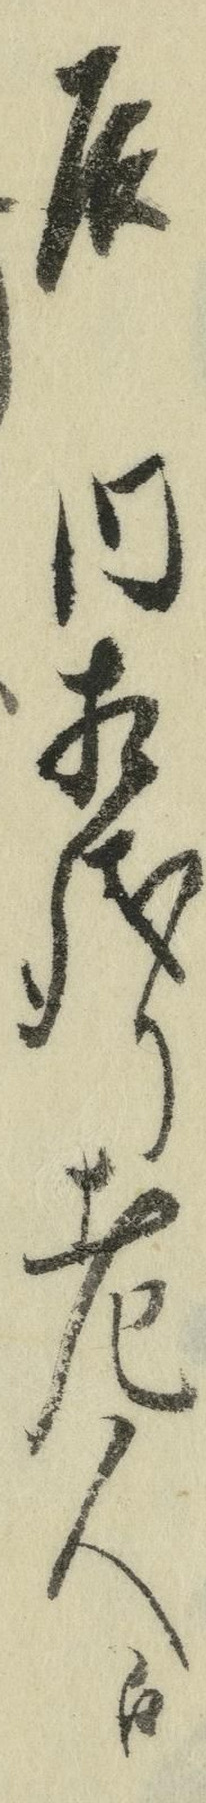内相残り老人江
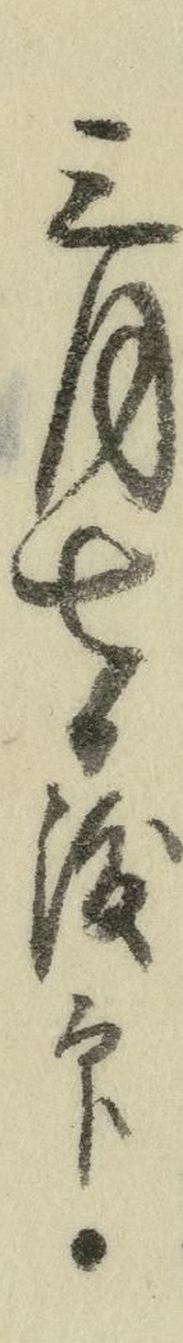辰三月七日渡印
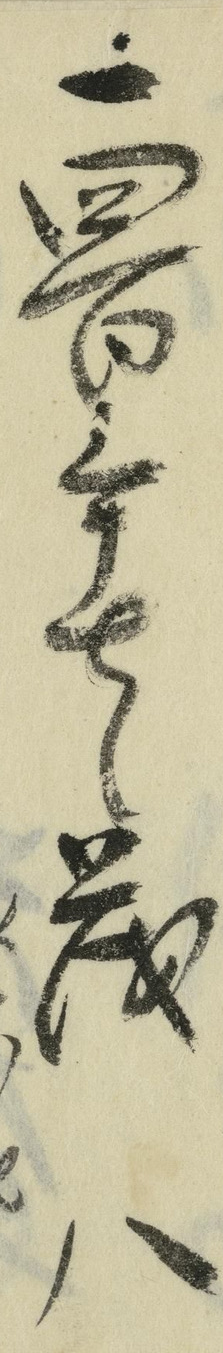一四百三十七文茂八
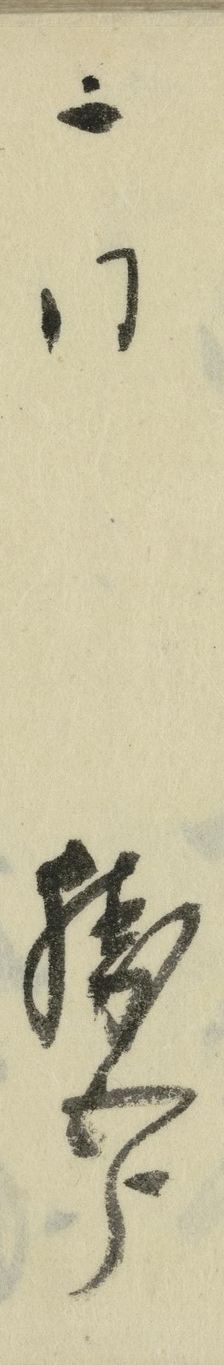一同勝五郎
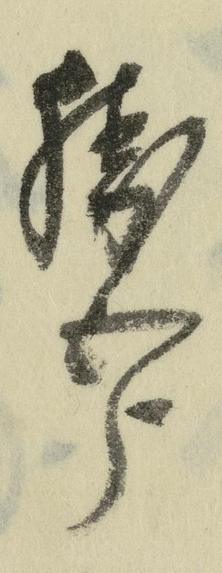一同勝五郎
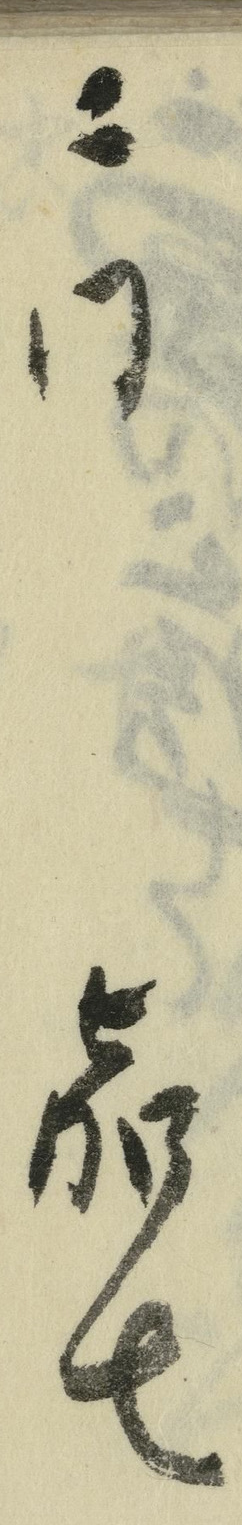一同嘉七
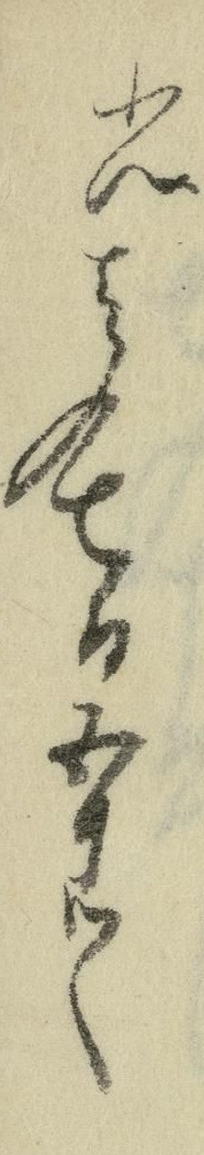小以壱〆七百五十弐文

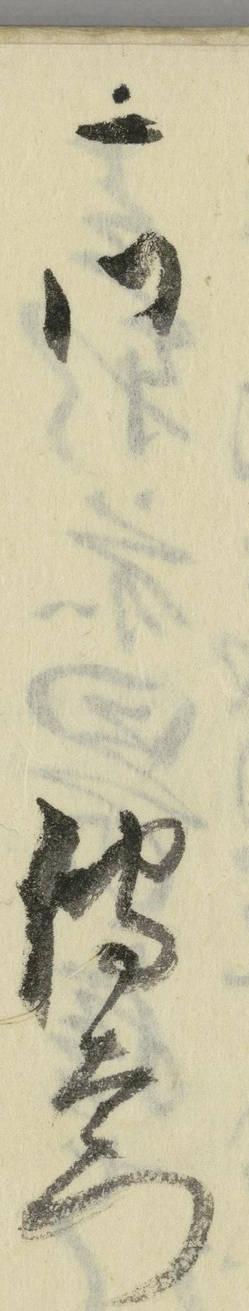一同伝右衛門
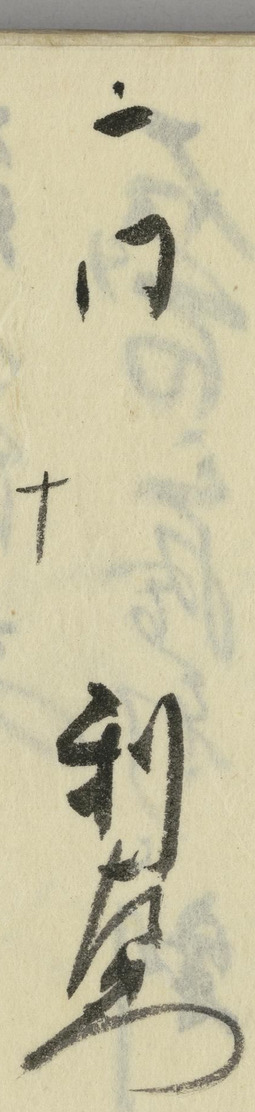一同十利左衛門
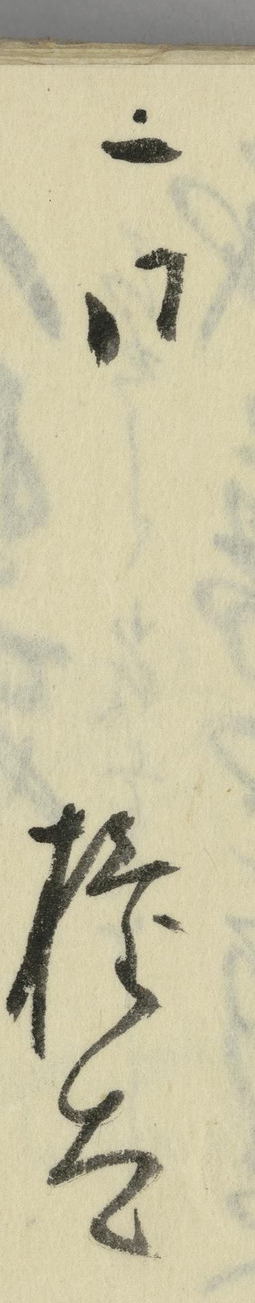一同権太
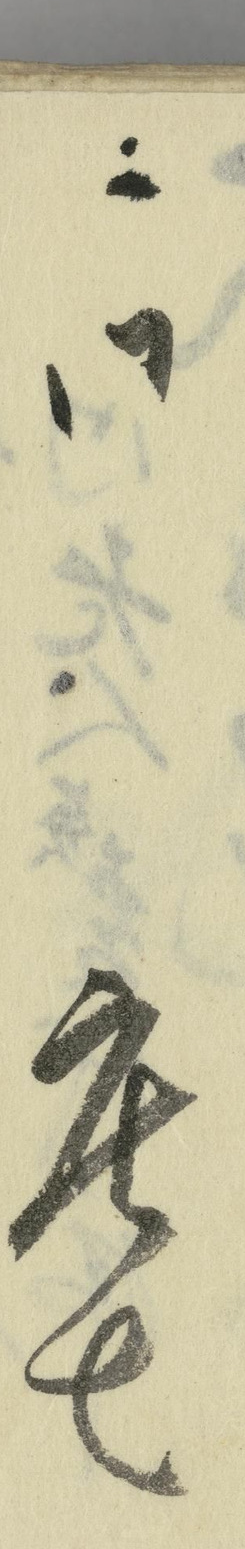一同庄七

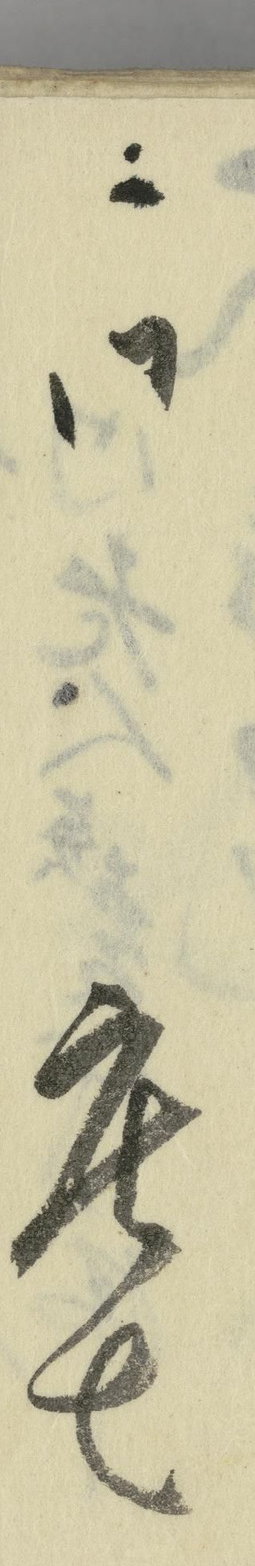一同幸七
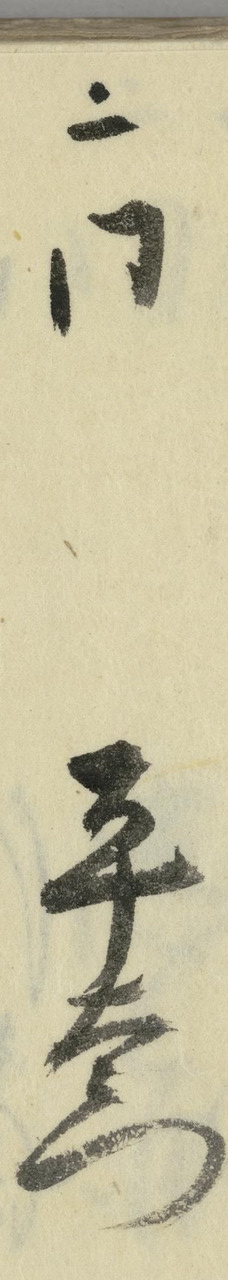一同平右衛門
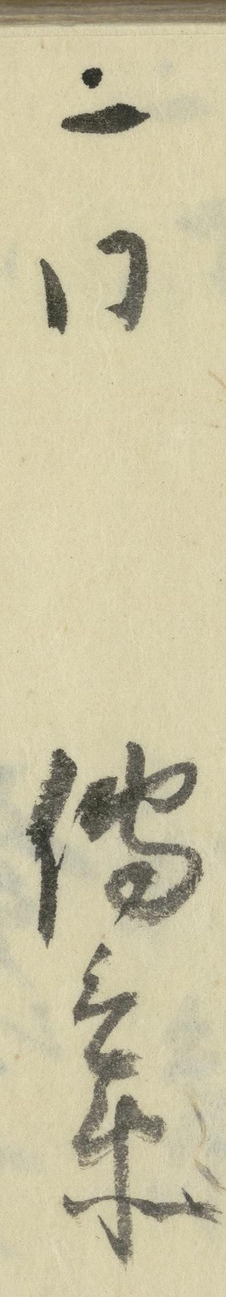一同伝兵衛
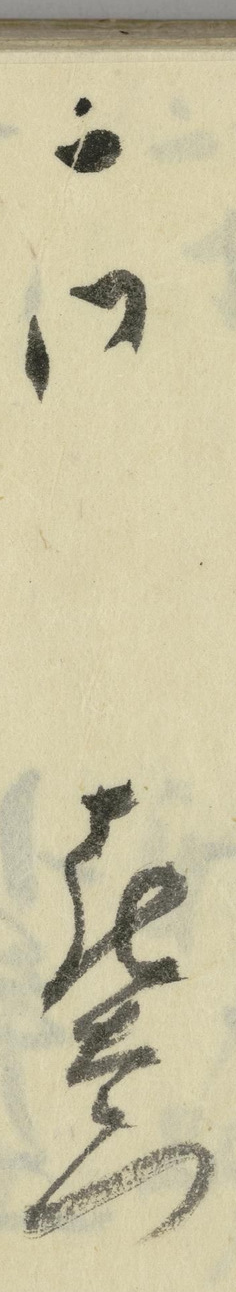一同喜右衛門
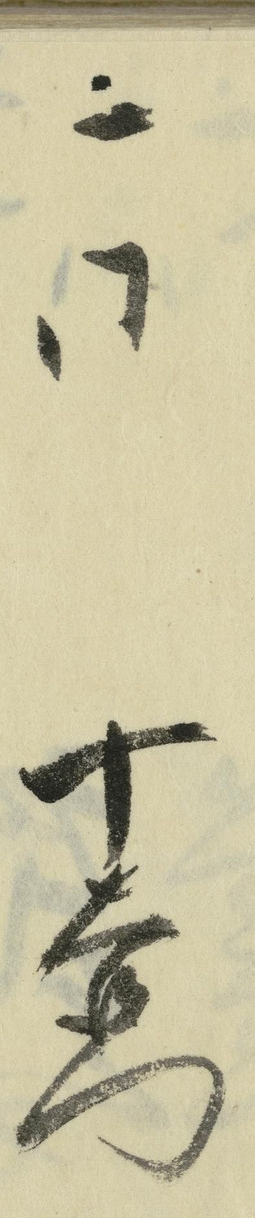一同十右衛門
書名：天明淺間噴火ニ関スル書類
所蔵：東京大学地震研究所図書室 Earthquake Research Institute Library, The University of Tokyo, JAPAN
